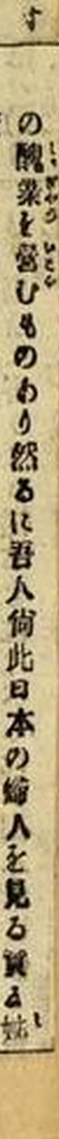の醜業を営むものあり然るに吾人尚此日本の婦人を見る実に姉
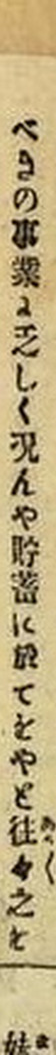べきの事業に乏しく況んや貯蓄に於てをやと往々之を
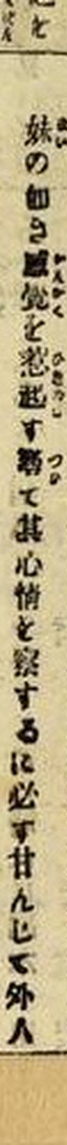妹の如き感覚を惹起すて其心情を察するに必す甘んじて外人
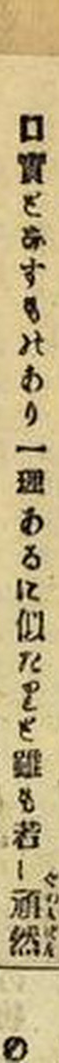口実となすものあり一理あるに似たりと雖も若し頑然
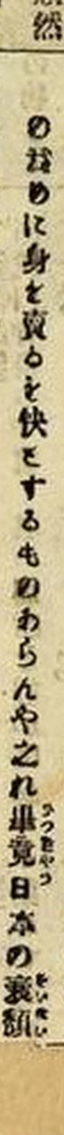の求めに身を売るを快とするものあらんや之れ畢竟日本の衰頽
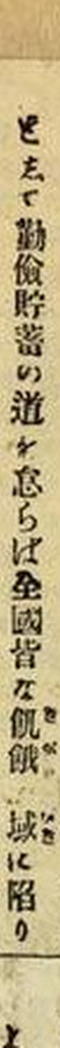として勤倹貯蓄の道を怠らば全国皆な飢餓の域に陥り
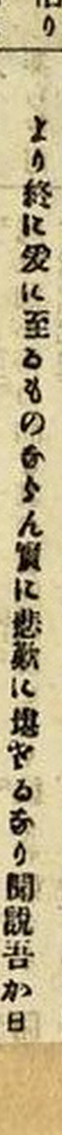より終に爰に至るものならん実に悲歎に堪さるなり聞説吾か日
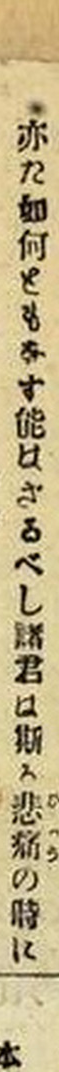亦た如何ともなす能はざるべし諸君は斯る悲痛の時に
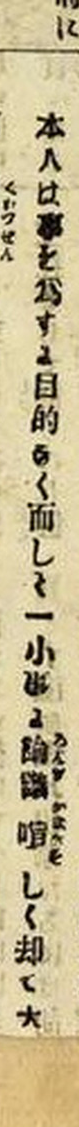本人は事を為すに目的なく而して一小事に論議喧しく却て大
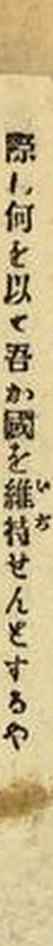際し何を以て吾か国を維持せんとするや
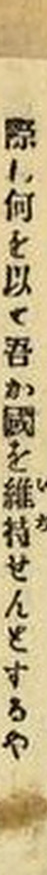際し何を以て吾か国を維持せんとするや
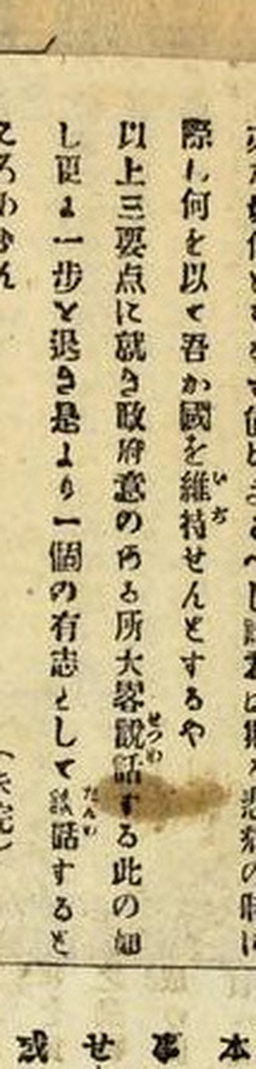以上三要点に就き政府意のある所大略説話する此の如
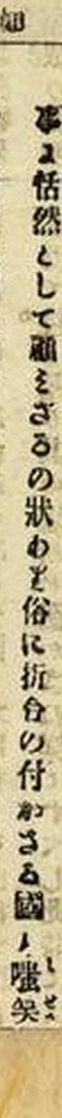事に恬然として顧みざるの状あり俗に折合の付かさる国と嗤笑
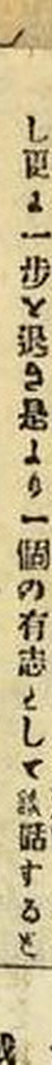し更に一歩を退き是より一個の有志として談話すると
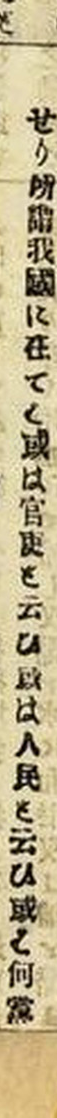せり所謂我国に在ては或は官吏と云ひ或は人民と云ひ或は何党
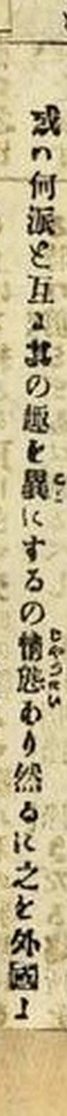或は何派と互に其の趣を異にするの情態あり然るに之を外国よ
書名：温古集 五巻
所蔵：福井県文書館 Fukui Prefectural Archives
